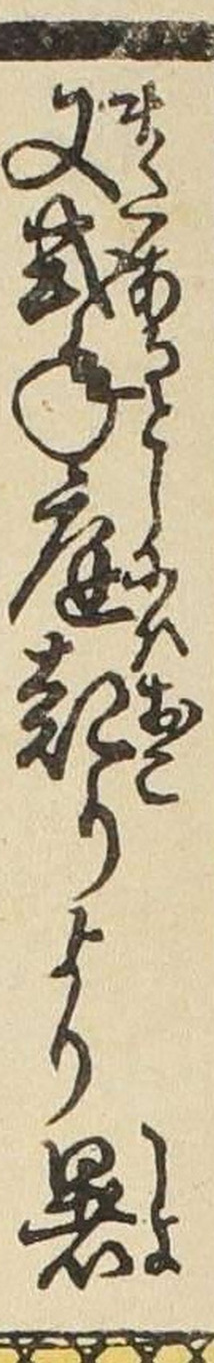又或年庭起りより暑
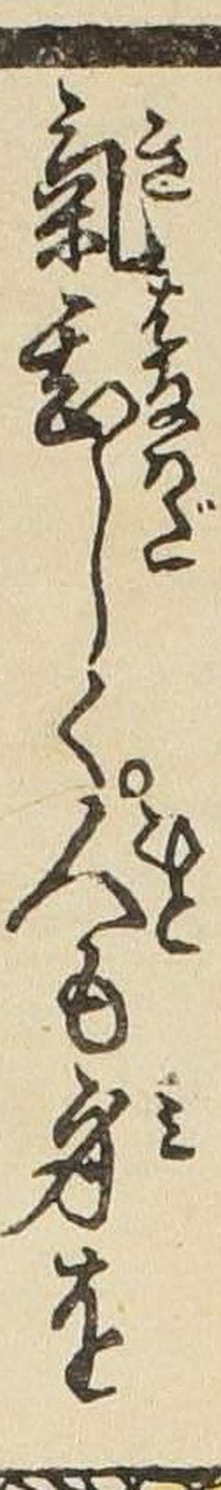気甚しく。人も身を
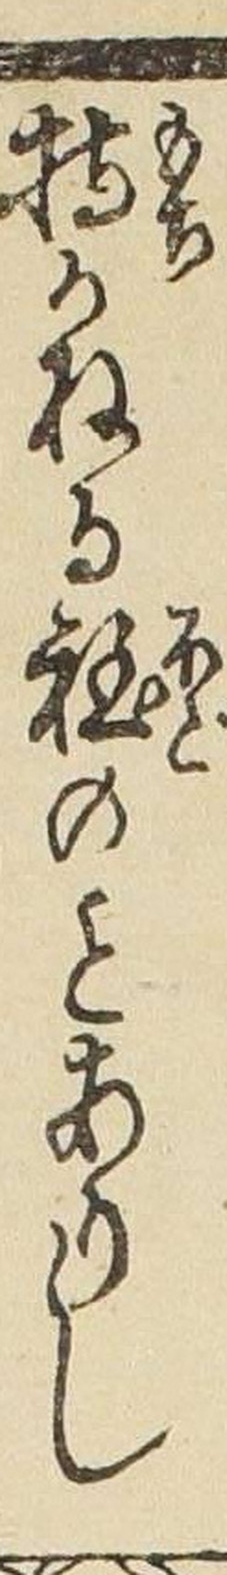持かねる程のことありし
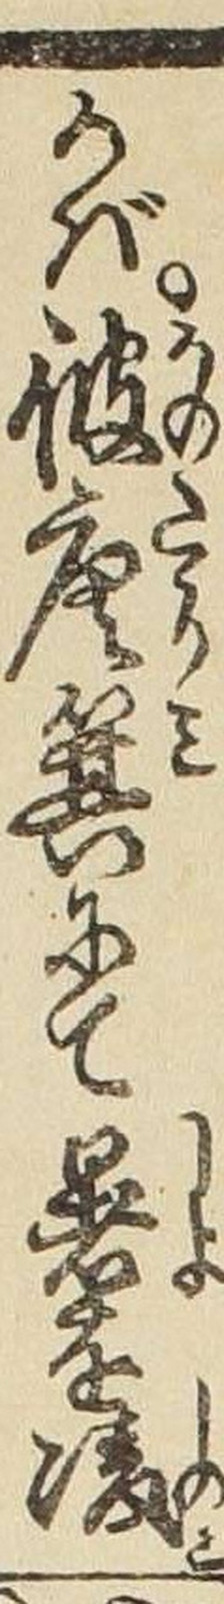かば。彼唐箕にて暑を凌
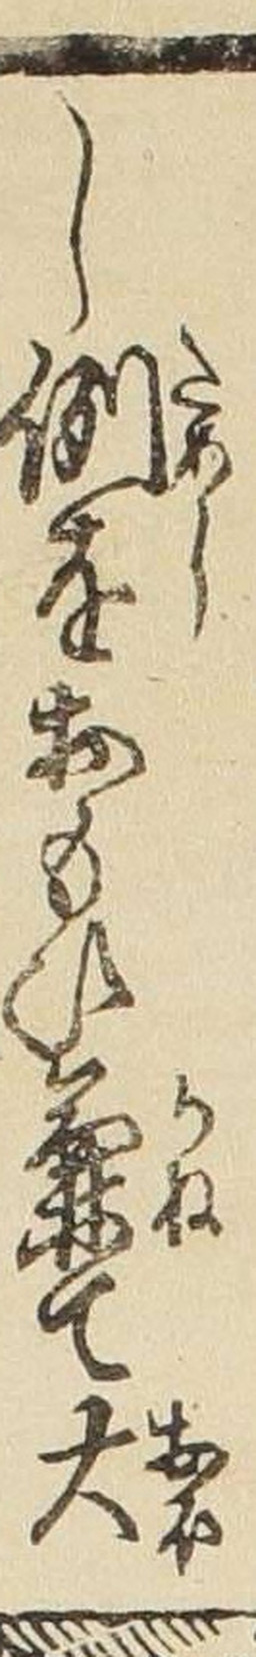し例をおもひ兼て大
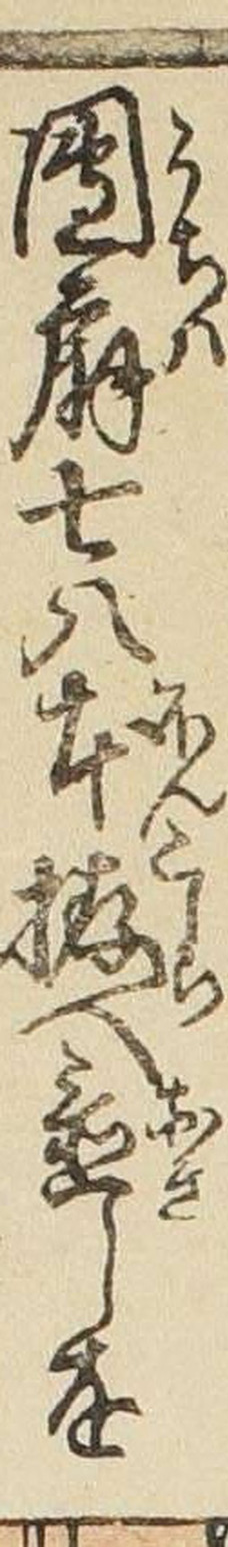団扇七八本拵へ置しを
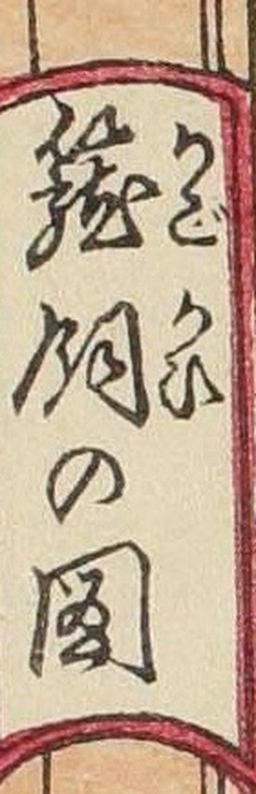籠飼の図
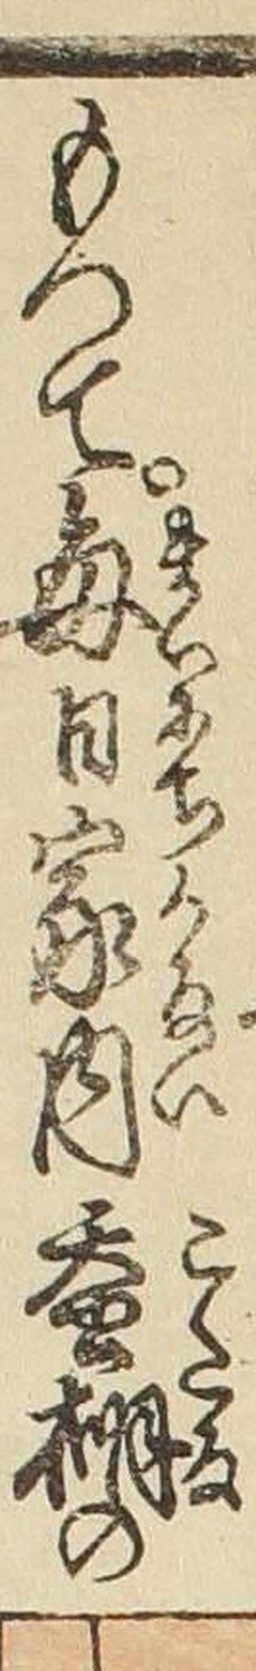もつて。毎日家内蚕棚の
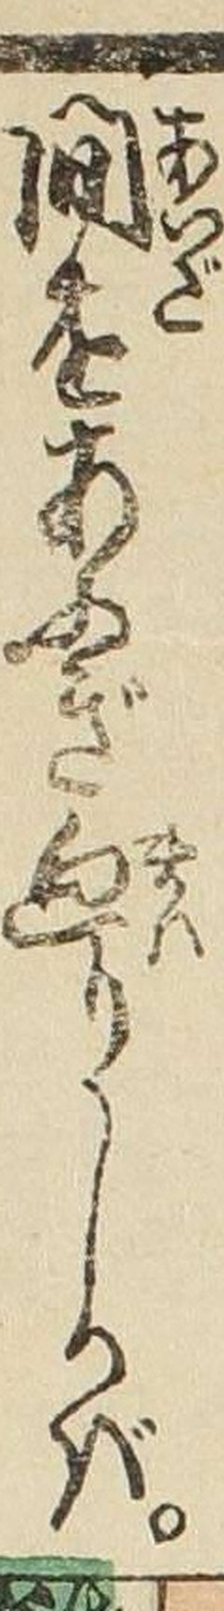間をあふぎ廻りしかば。
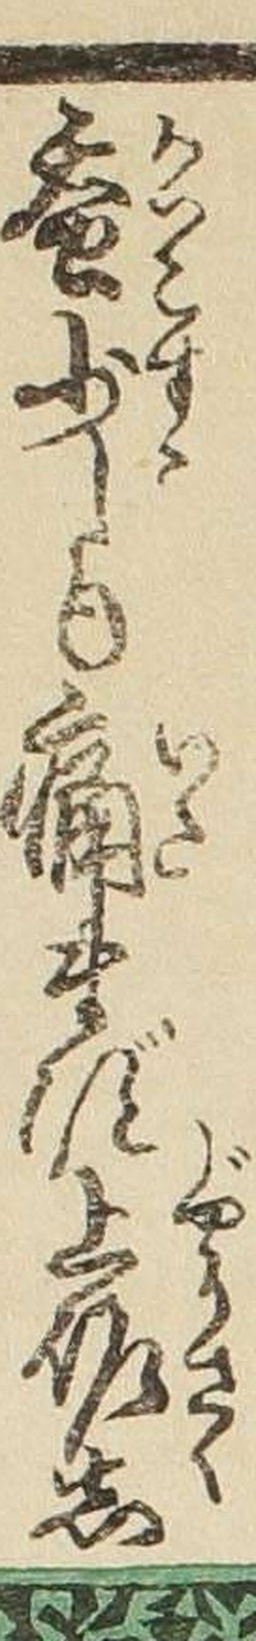蚕少しも痛まず上作し
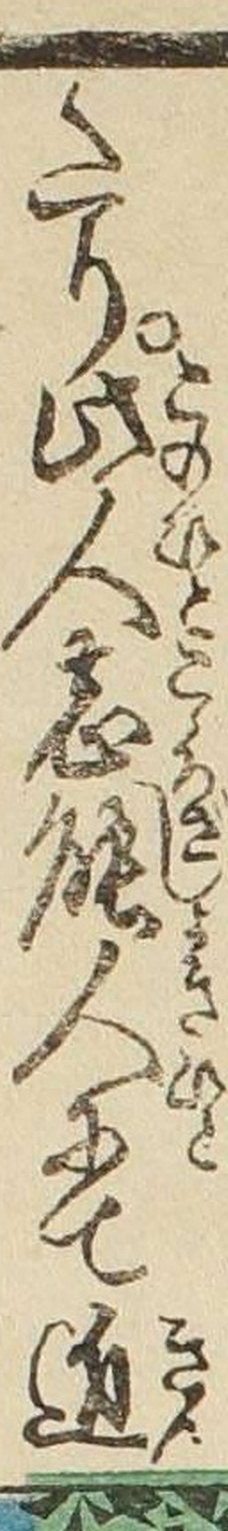たり。此人志能人にて近
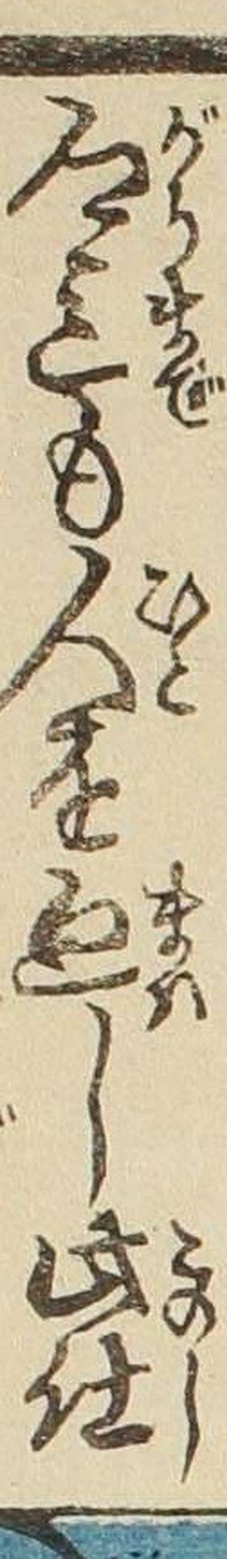郷迄も人を廻し此仕
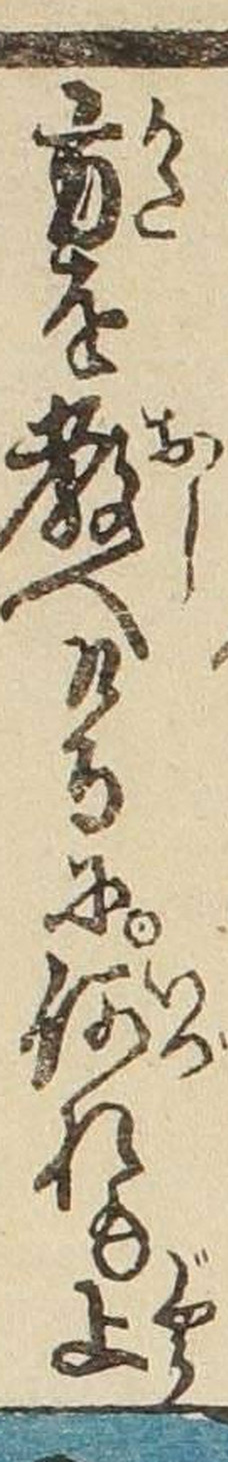方を教へけるに。何れも上
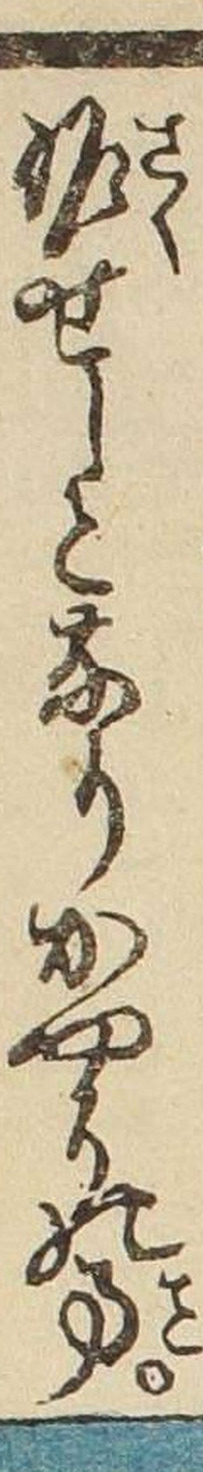作せしとなりかやうの事。

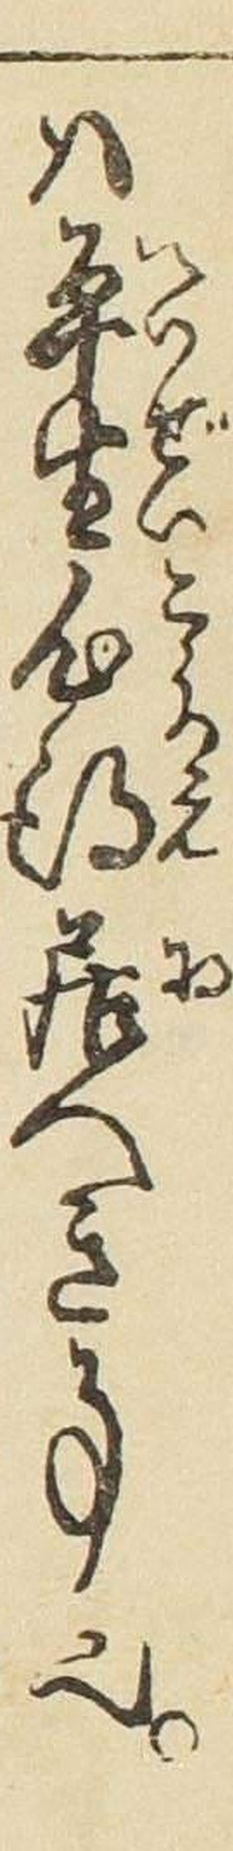は平生心得居へき事也。
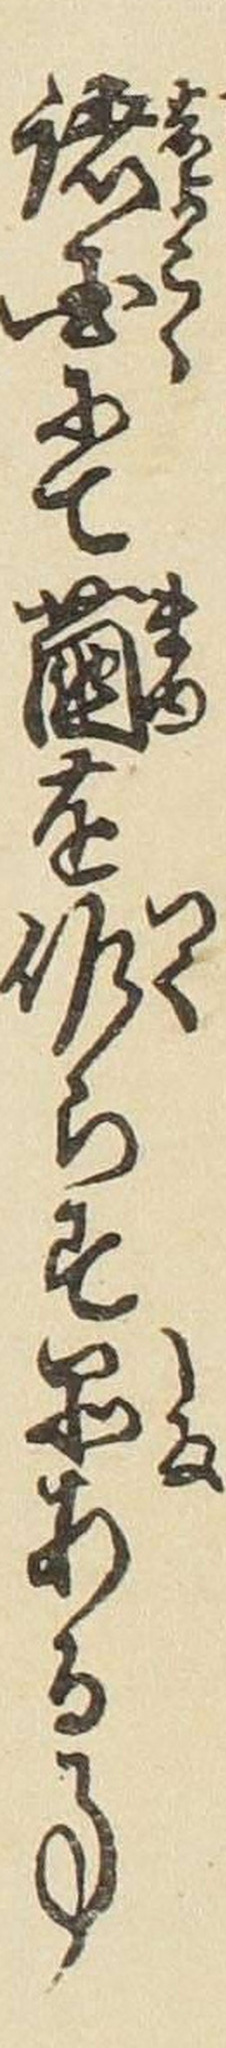諸国にて繭を作らす品ある事
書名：養蠶圖解
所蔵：東京大学農学生命科学図書館 国文学研究資料館
